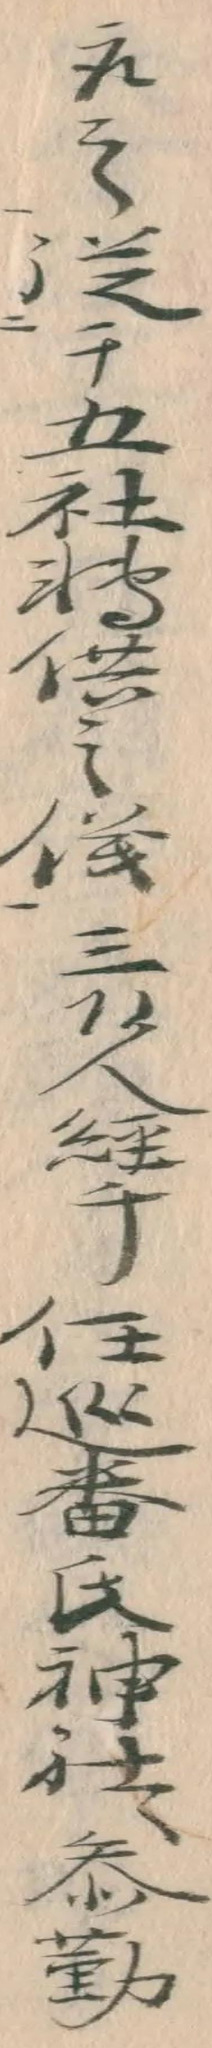取之従于五社轉供之儀三頭人経千任巡番氏神社へ参勤
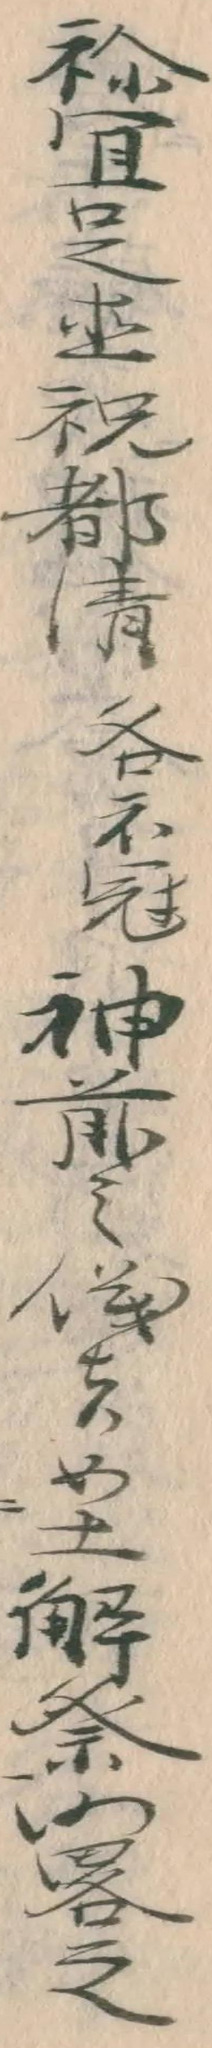称宜足直祝都清各衣冠神前之儀は如土解祭仍畧之
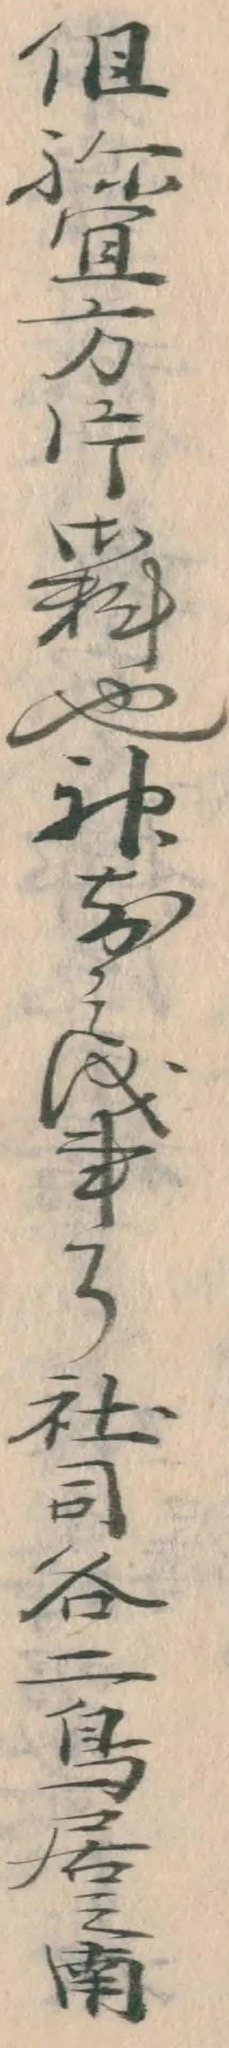但祢宜方片御料也神前之儀事了社司各二鳥居之南
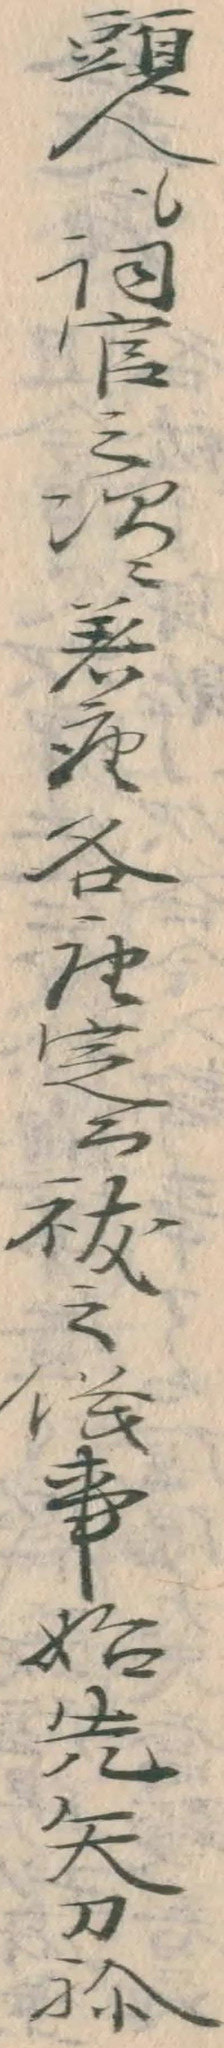頭人も祠官之次に着座各座定而祓之儀事始先矢刀祢
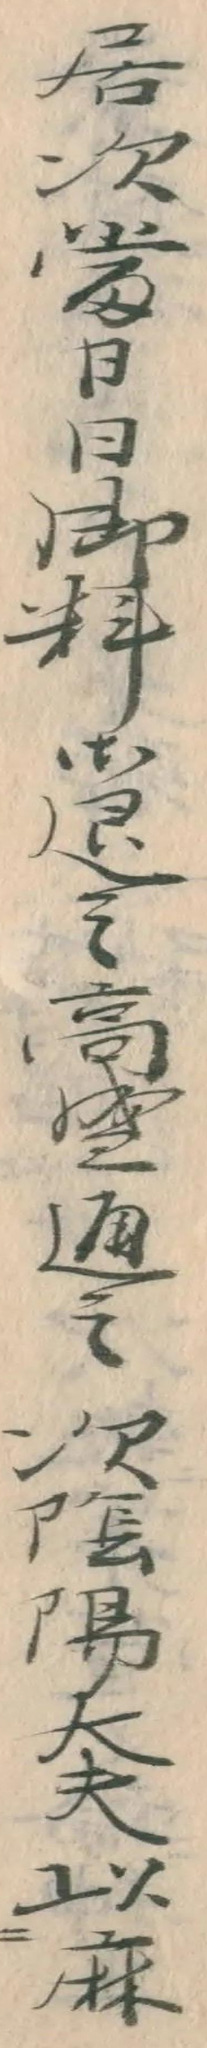居次當日日御科御退之高盛通之次陰陽大夫以麻

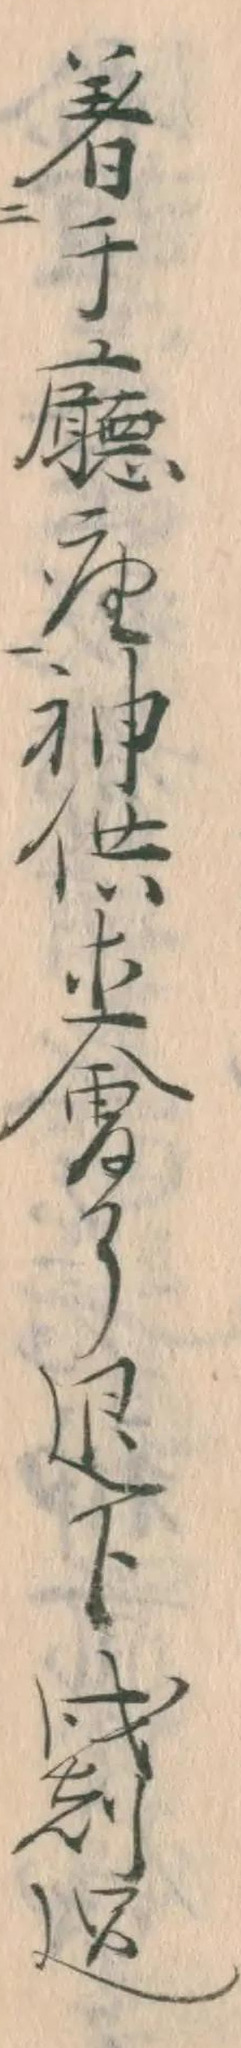着于廰座神供直會了退下戌刻過
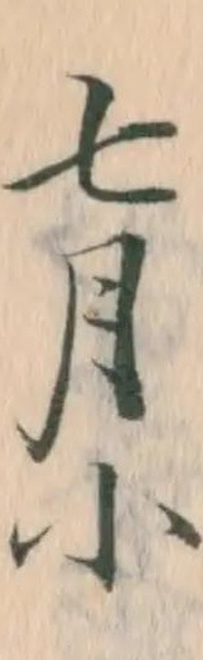七月小
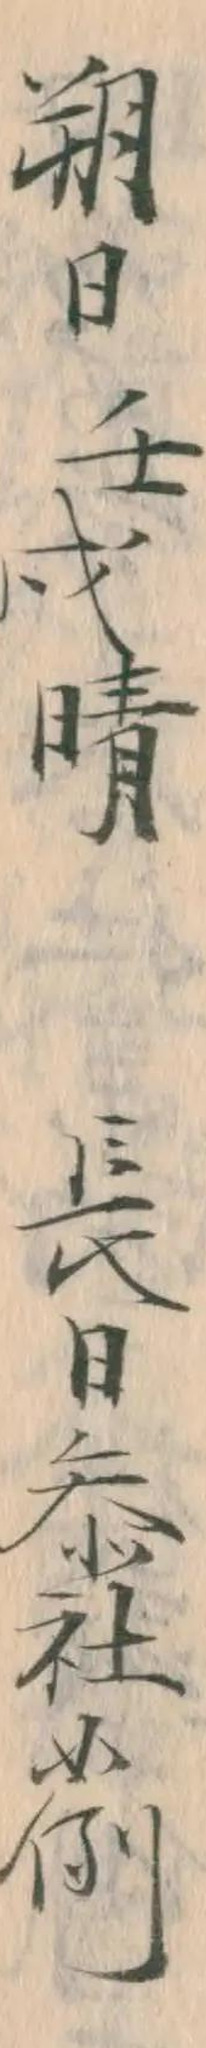朔日壬戌晴長日参社如例
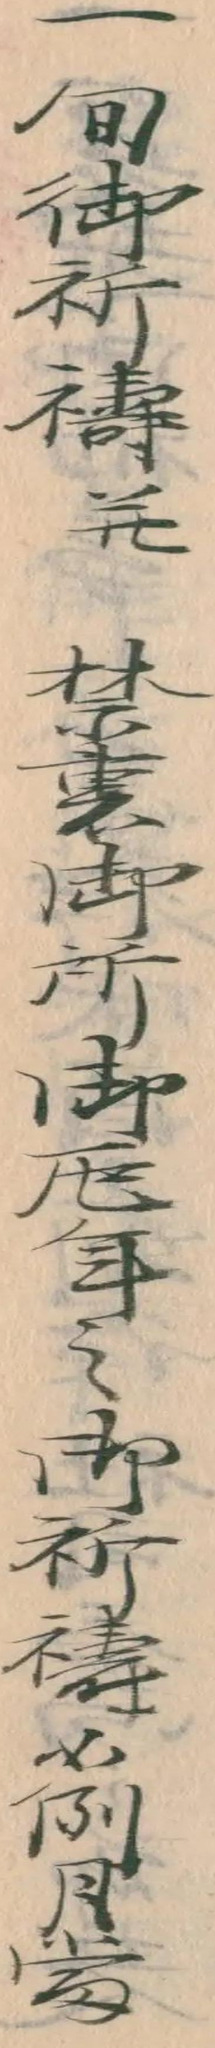一旬御祈祷并禁裏御所御厄年之祈祷如例月番
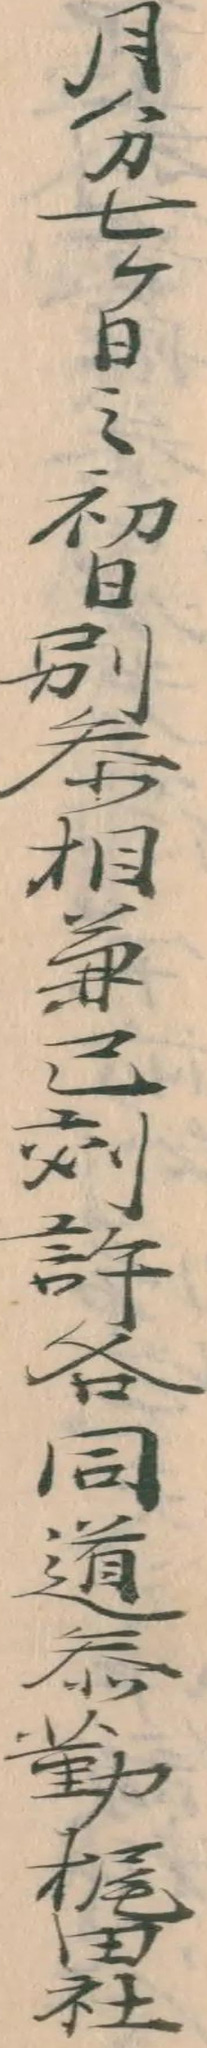月分七ケ日之初日別参相兼巳刻許各同道参勤梶田社
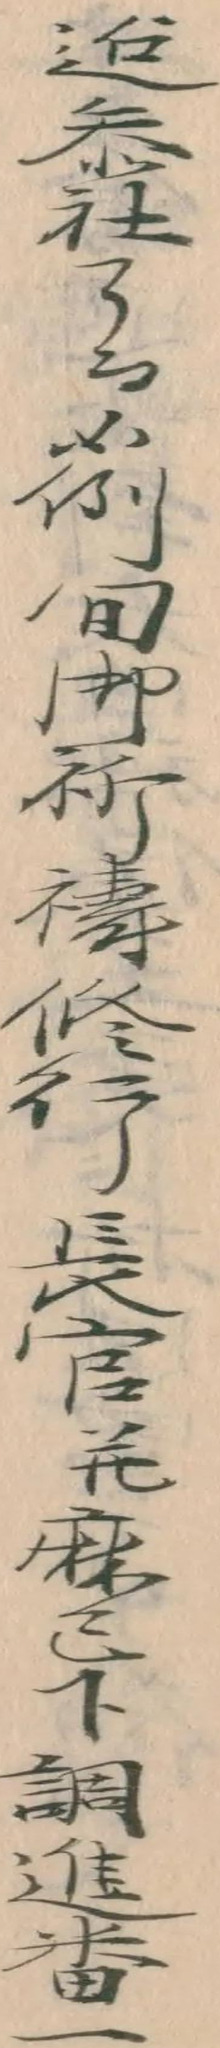迄参社了而如例旬御祈祷修行長官并麻已下調進番一
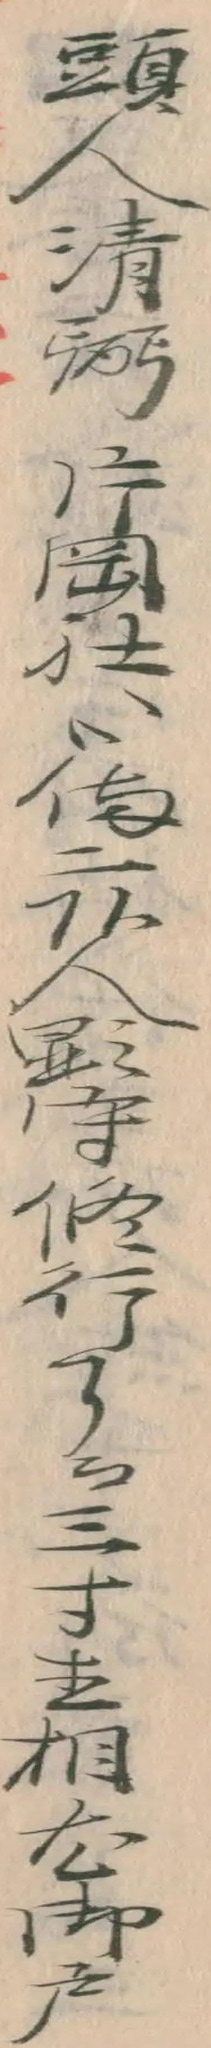頭人清弼片岡社へ御備二頭人顕守修行了而三寸直相尤御戸
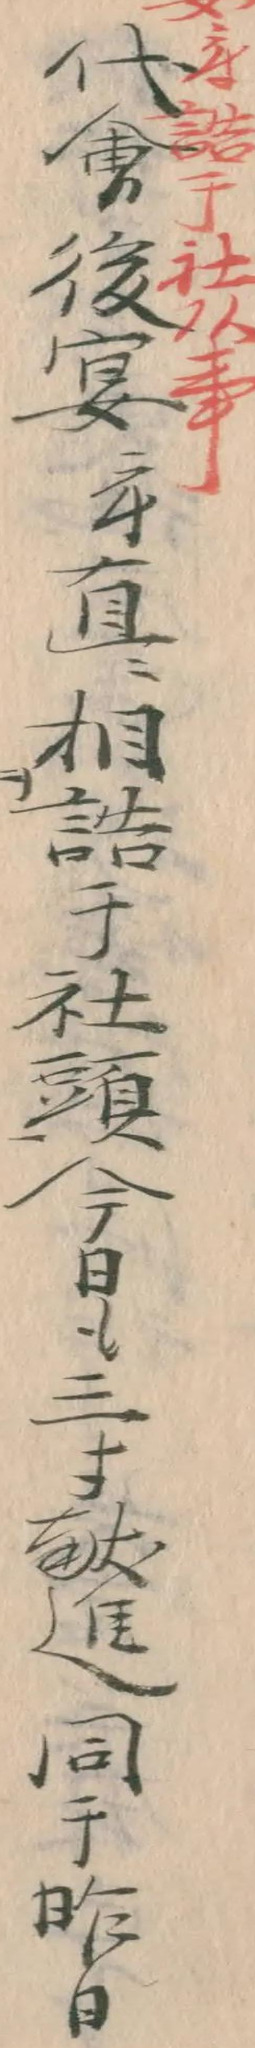代會後宴ニ付直ニ相詰于社頭今日も三寸献進同于昨日
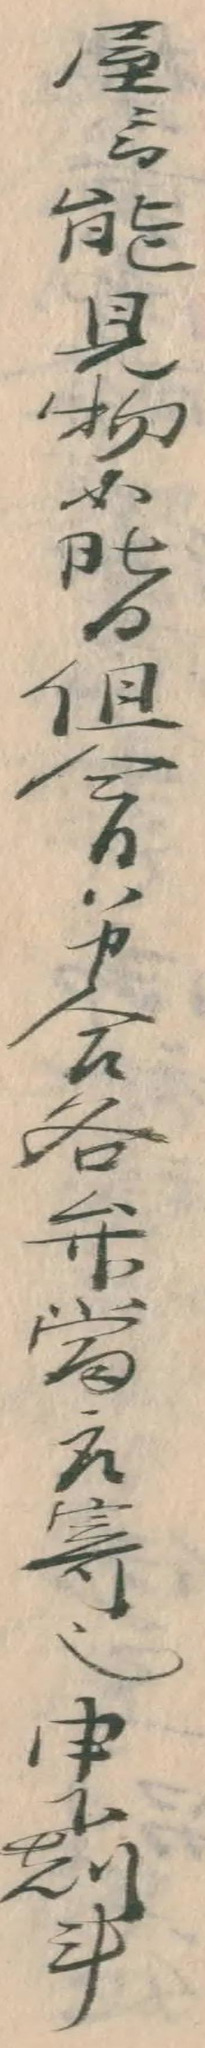屋ニ而能見物如昨日但今日ハ申合各弁當取寄也申下刻斗
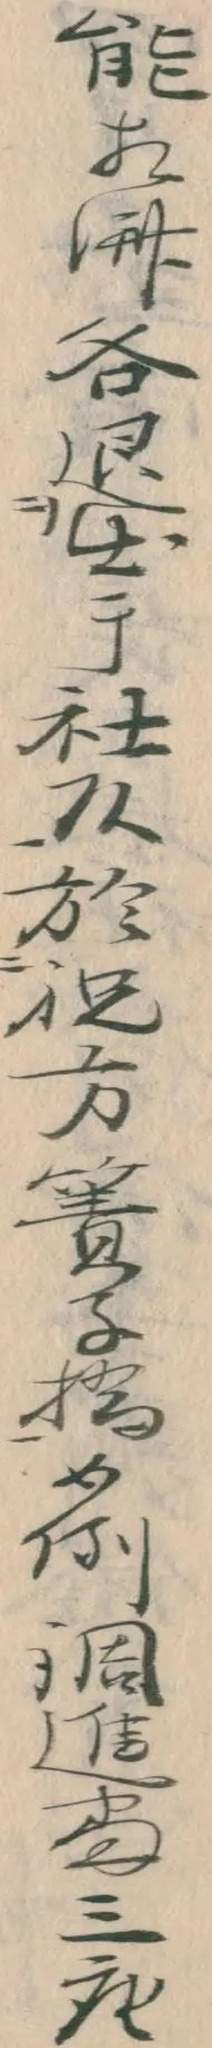能相済各退出于社頭於祝方簀子橋如例調進番三座
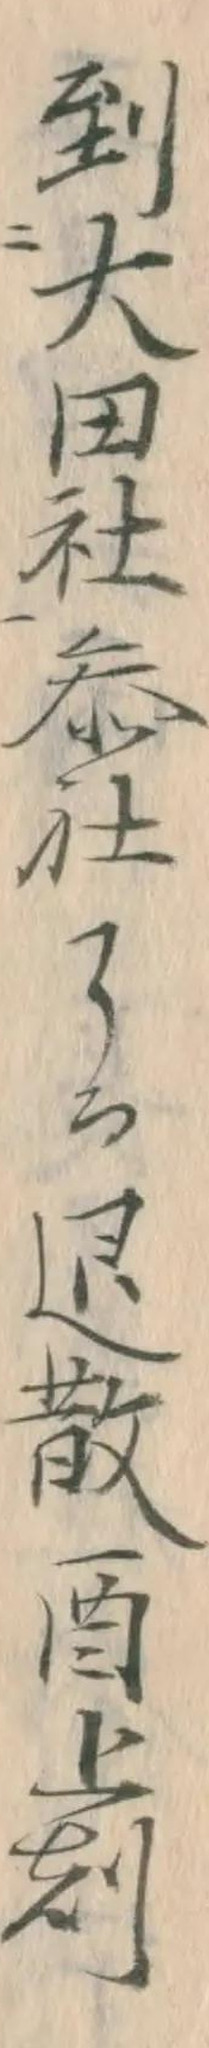到大田社参社了而退散酉上刻
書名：賀茂社記録. 第73冊
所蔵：国立国会図書館 National Diet Library, JAPAN
